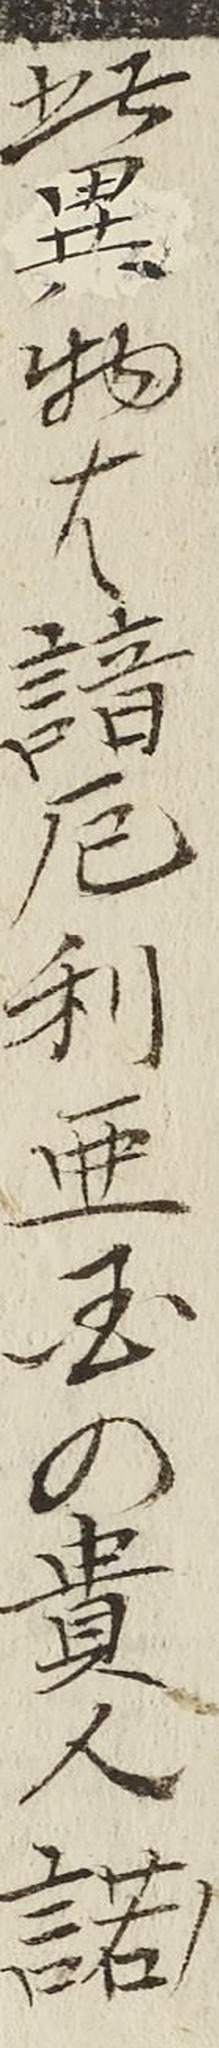此異物は諳厄利亜国の貴人諾
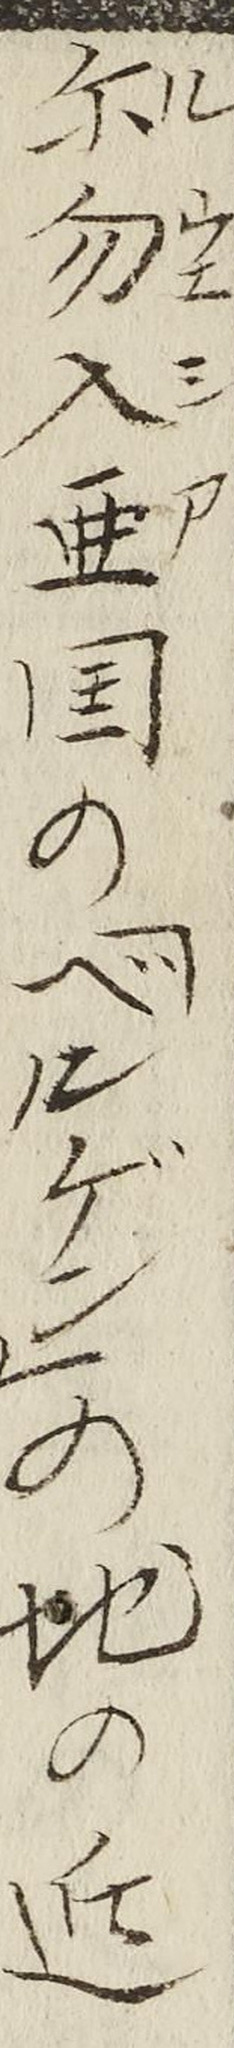尓勿入亜国の「ベルゲン」の地の近
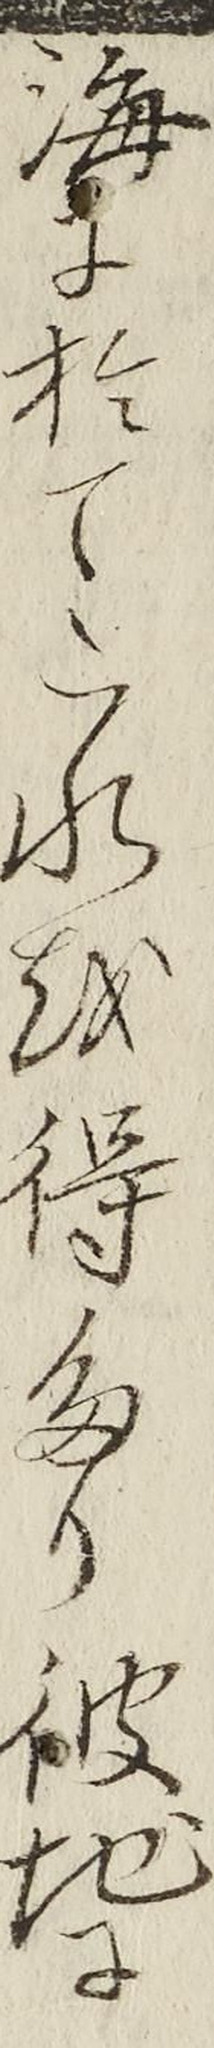海に於てこれを得たり彼地に
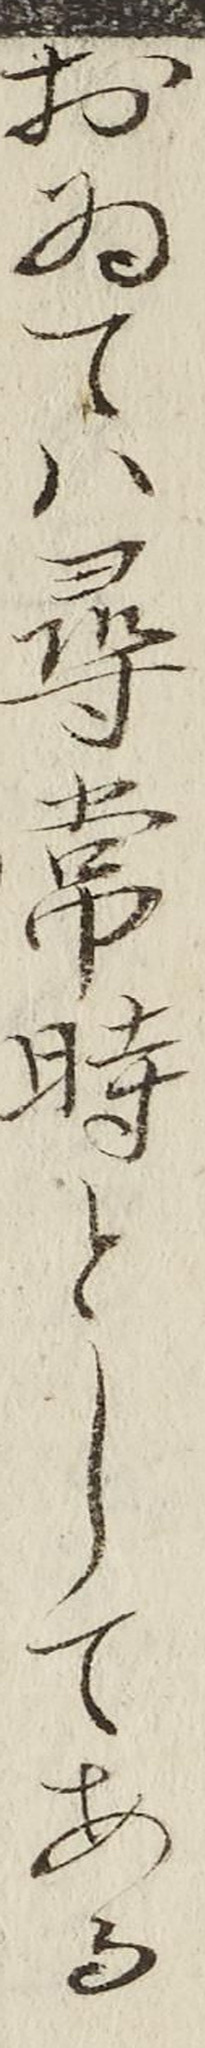おゐてハ尋常時としてある
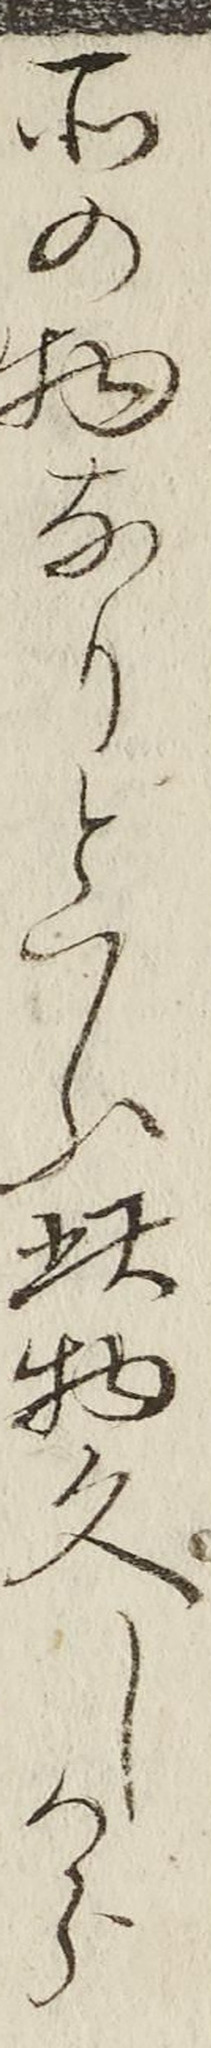所の物なりといふ此物久しから
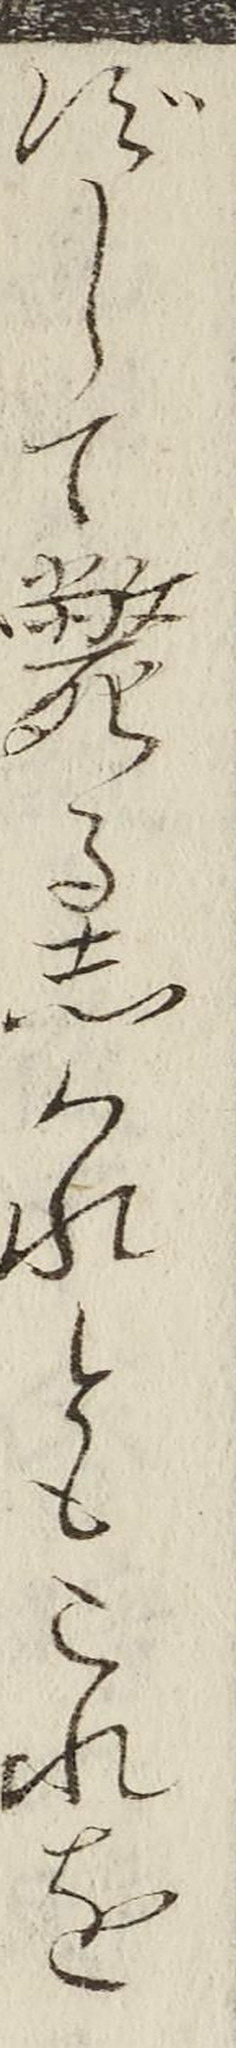ずして斃るしかれともこれを
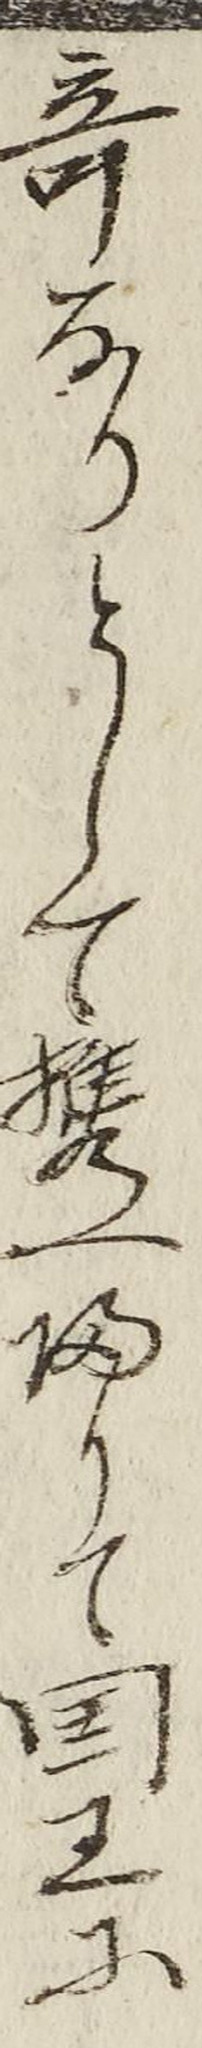奇なりとして携へ帰りて国王に
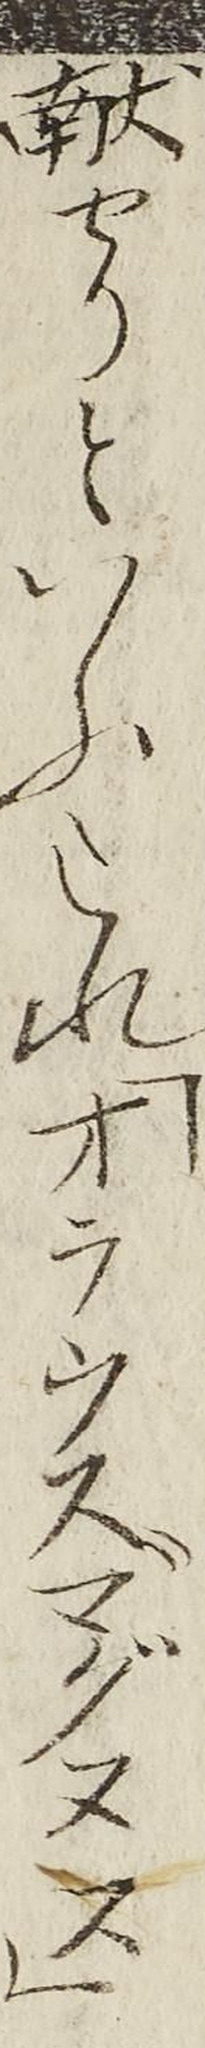献せりといふこれ「オラウス〃マグヌス」
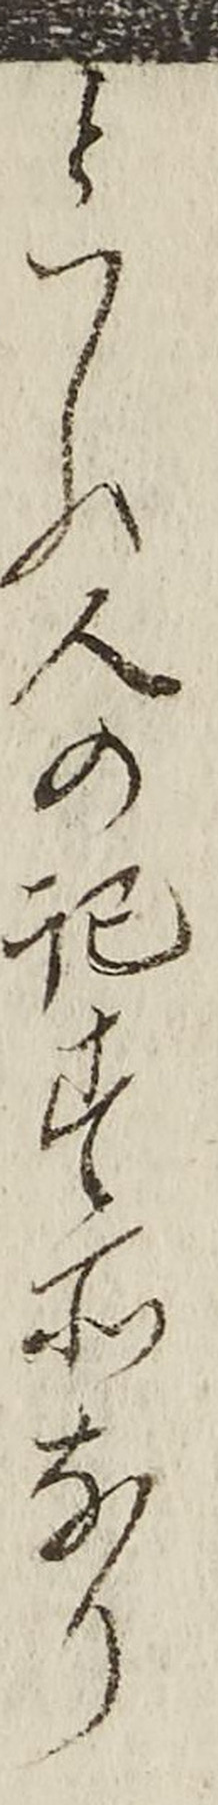といふ人の記す所なり

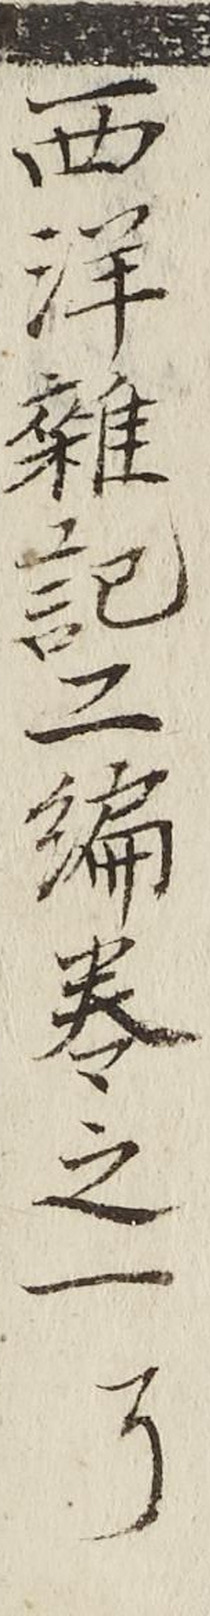西洋雑記二編巻之一了
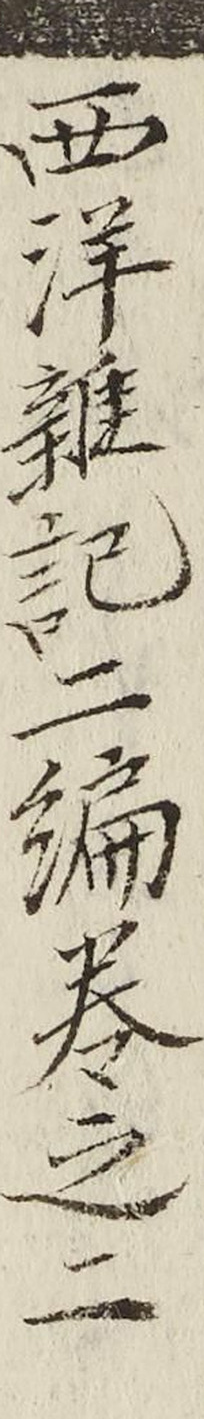西洋雑記二編巻之二
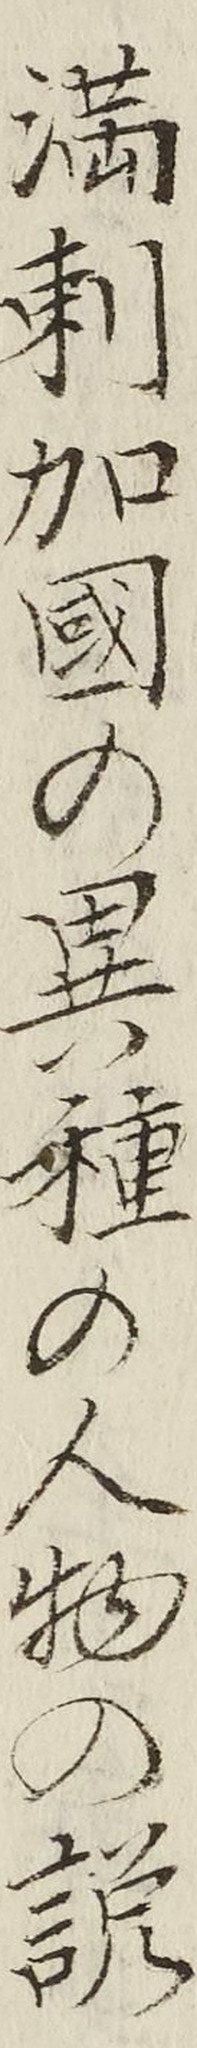満刺加国の異種の人物の説
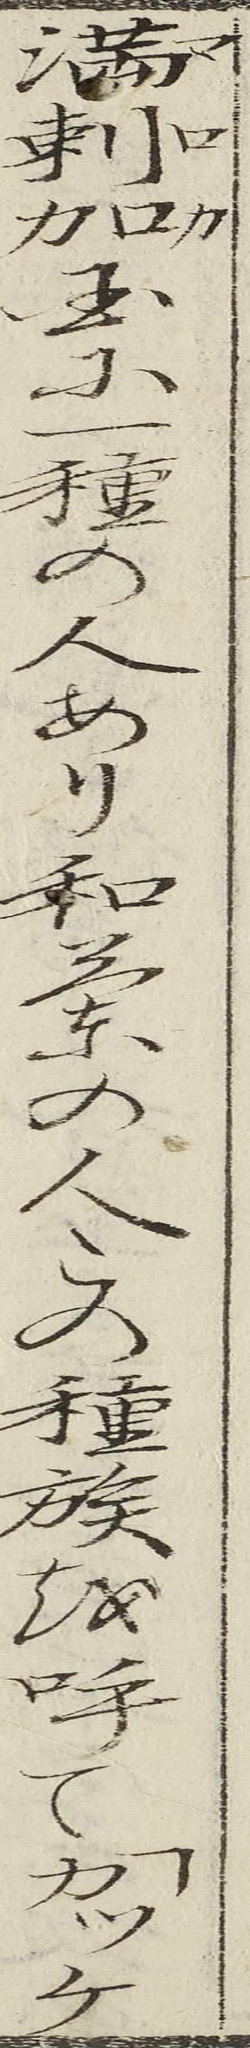満刺加国に一種の人あり和蘭の人この種族を呼て「カッケ
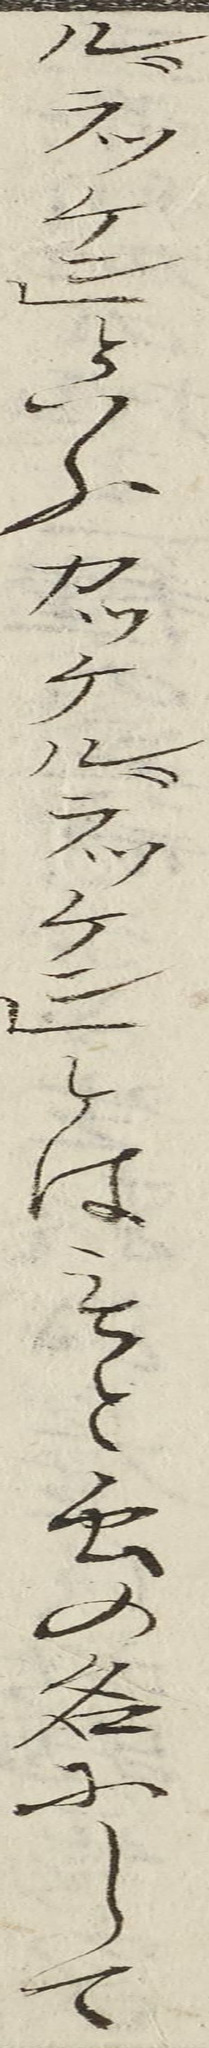ル。ラッケン」といふカッケル。ラッケン」とはもと虫の名にして
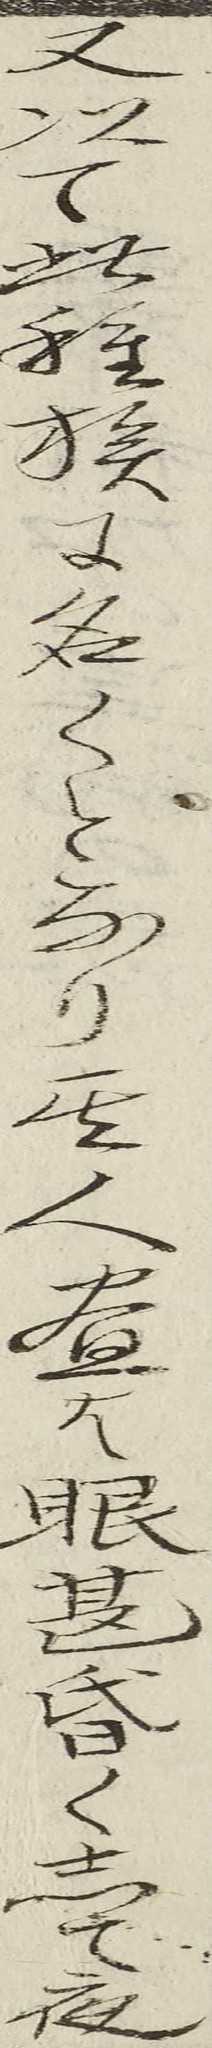又以て此種族に名くとなり其人昼は眼甚昏くして夜
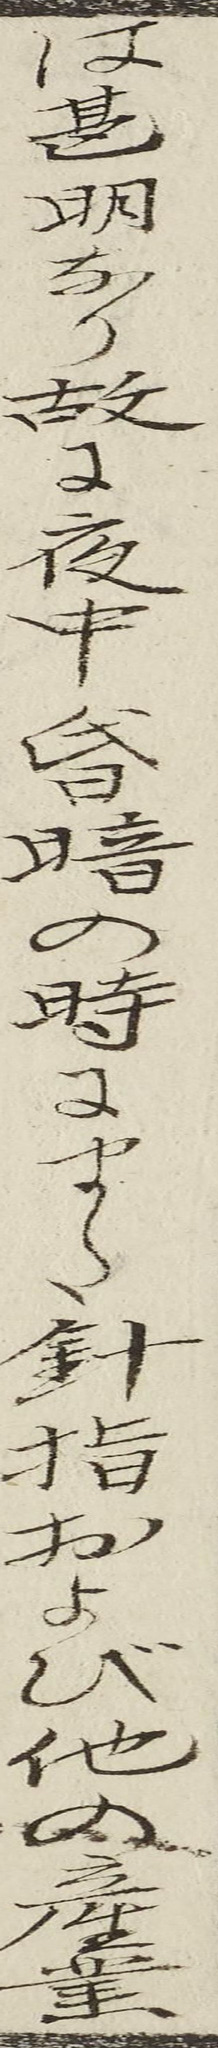は甚明なり故に夜中昏暗の時にまた針指および他の産業
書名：西洋雜記　乾
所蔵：東京大学地震研究所図書室 Earthquake Research Institute Library, The University of Tokyo, JAPAN
